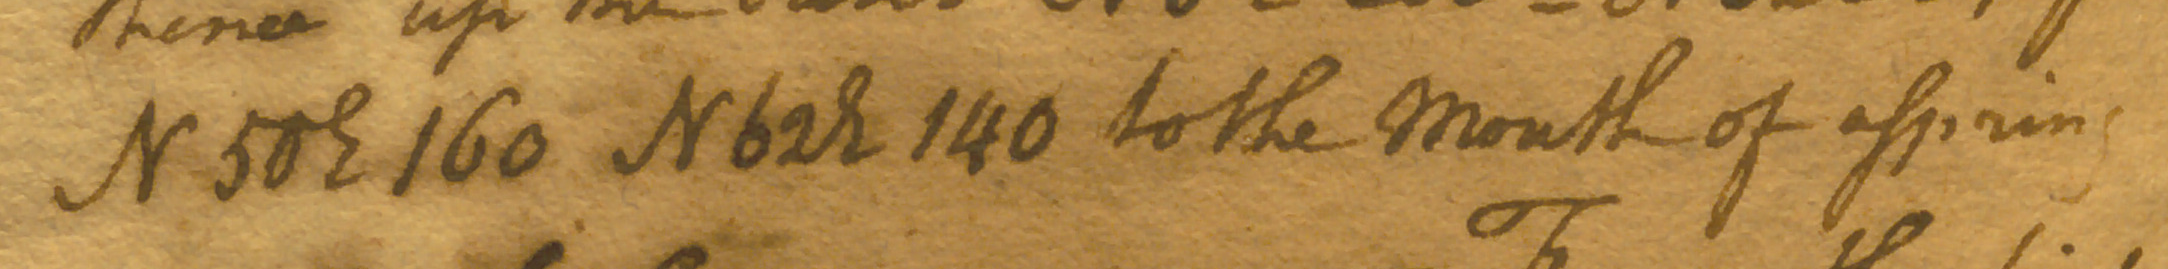N 50E 160 N62E 140 to the mouth of a spring
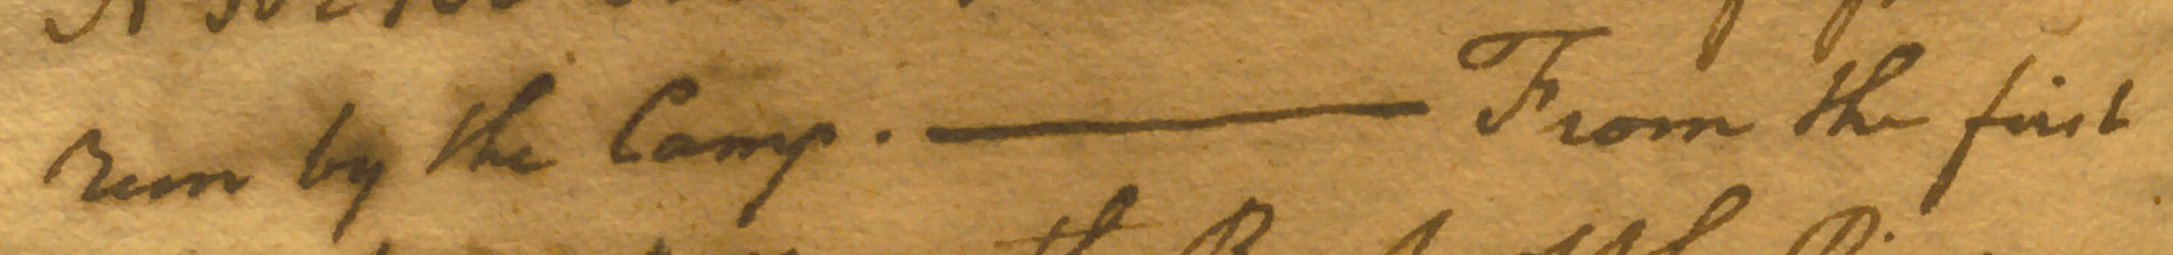run by the Camp.- From the first
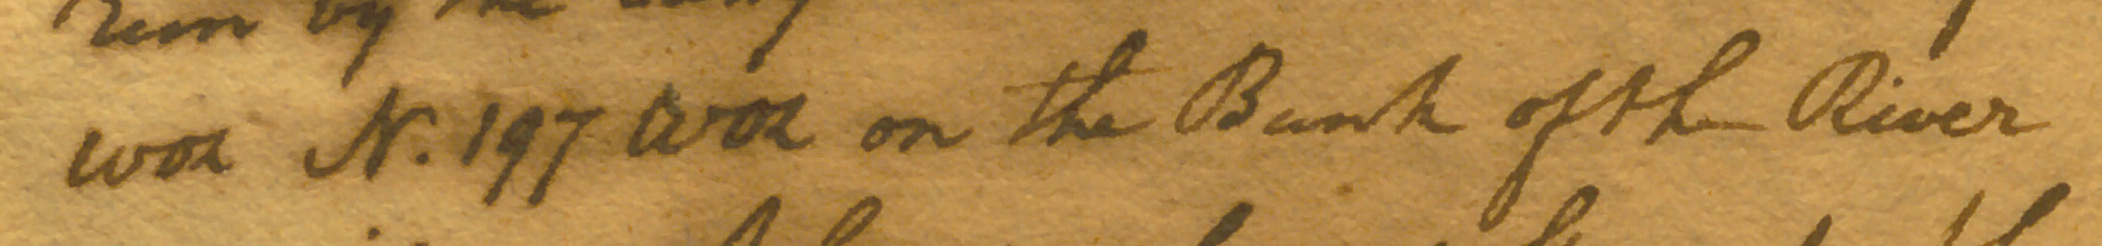W0h N. 197 W0h on the bank of the River
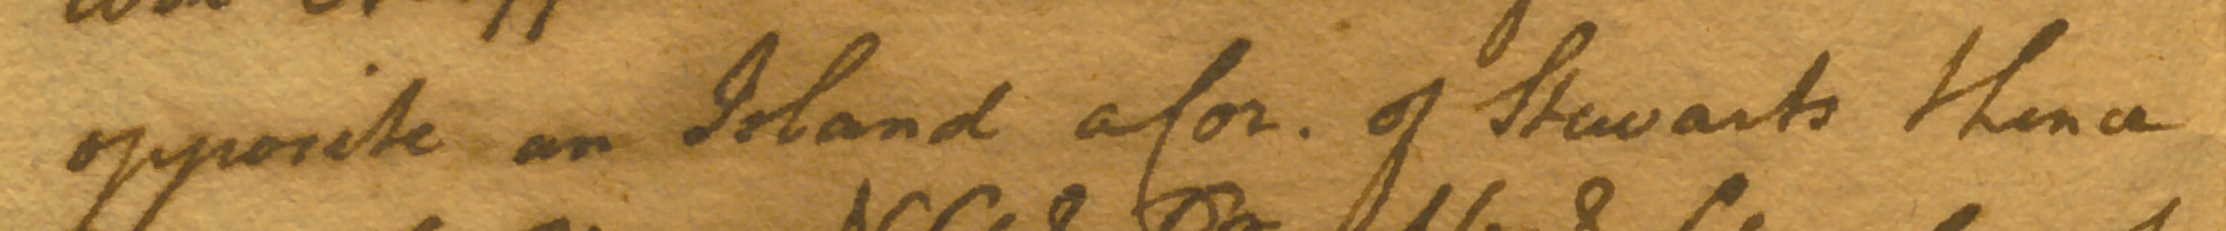opposite an Island a Cor. of Stewarts thence
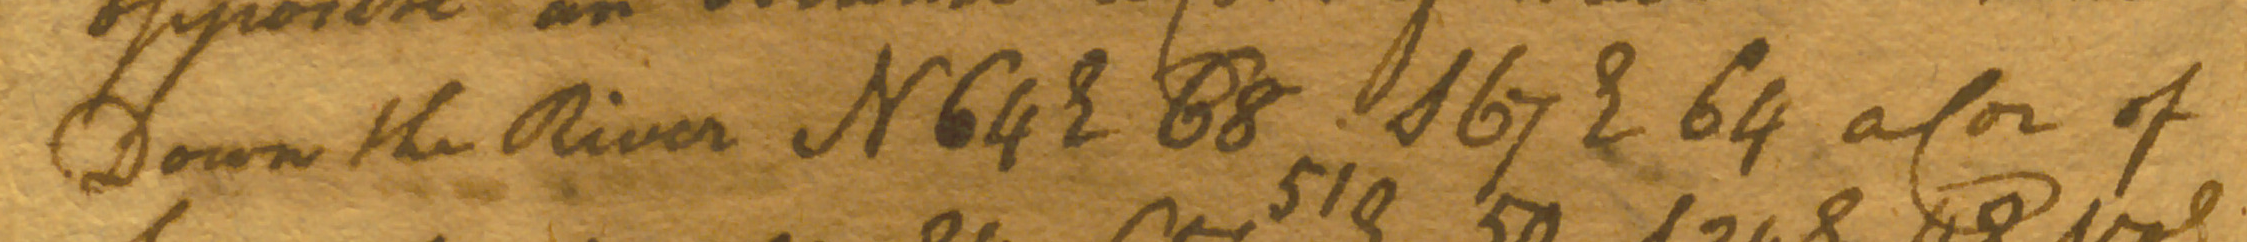Down the River N64E 68 S67 E 64 a Cor of
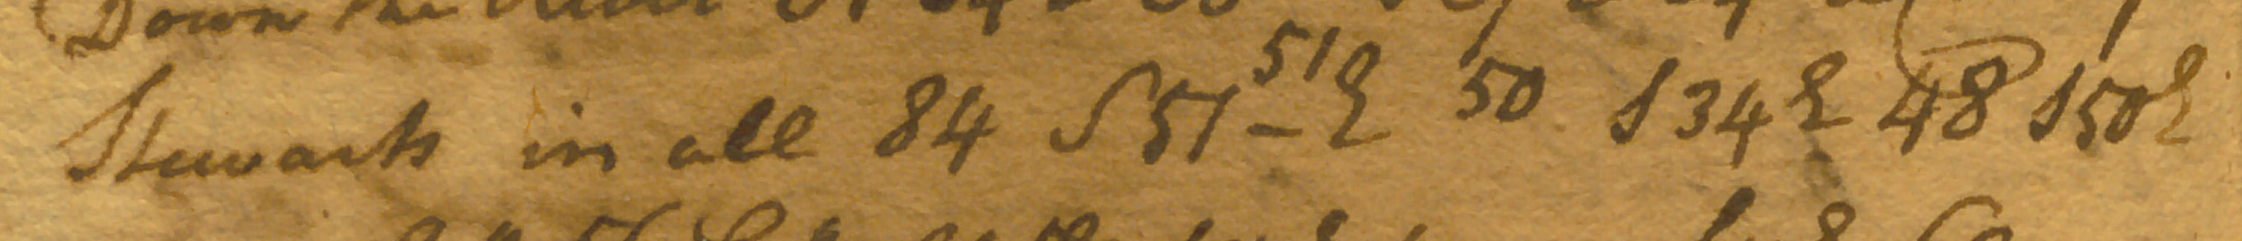Stewarts in all 84 S57-^51 E 50 S34E 48 S50E
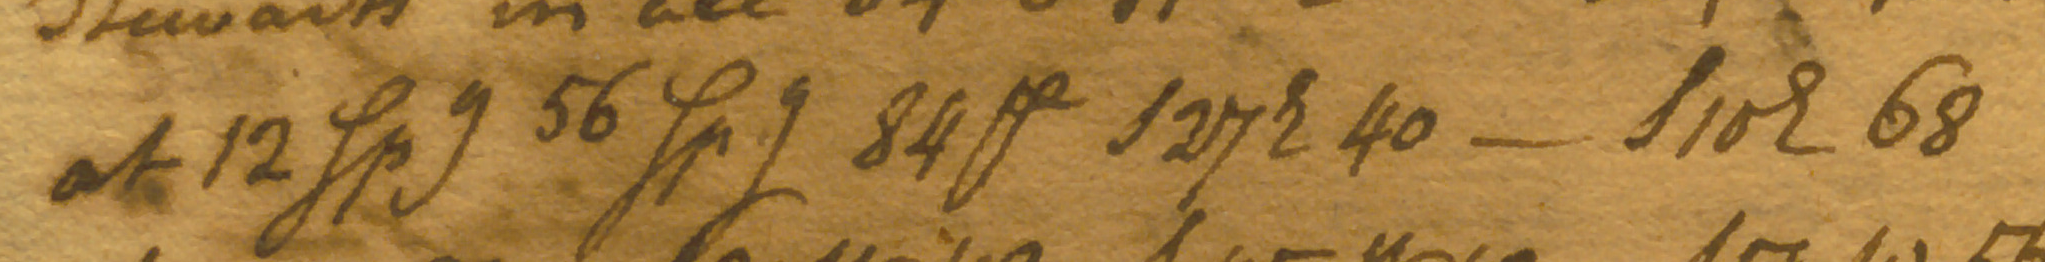at 12 Spg 25 Spg 84 per S27E40- S10E 68
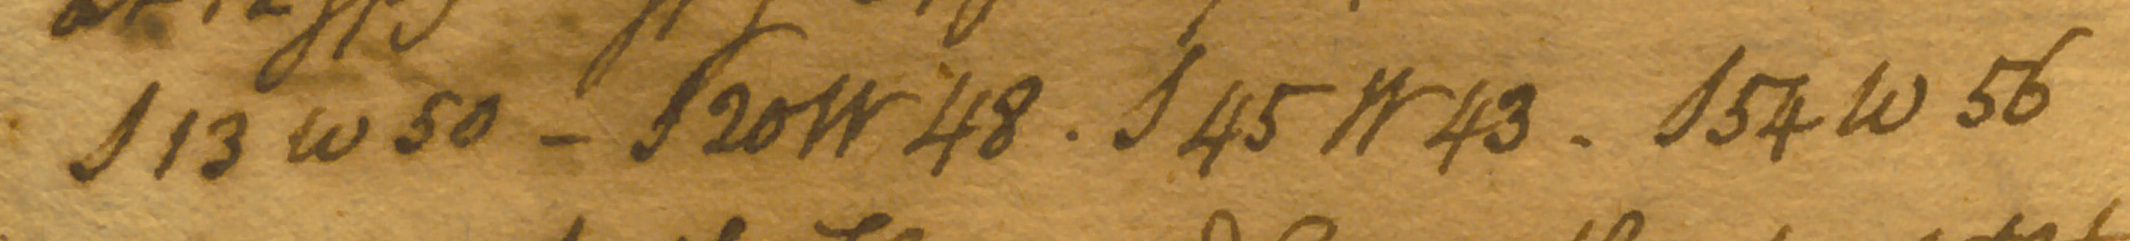S13 W50- S20W 48. S45 W43. S54W 56
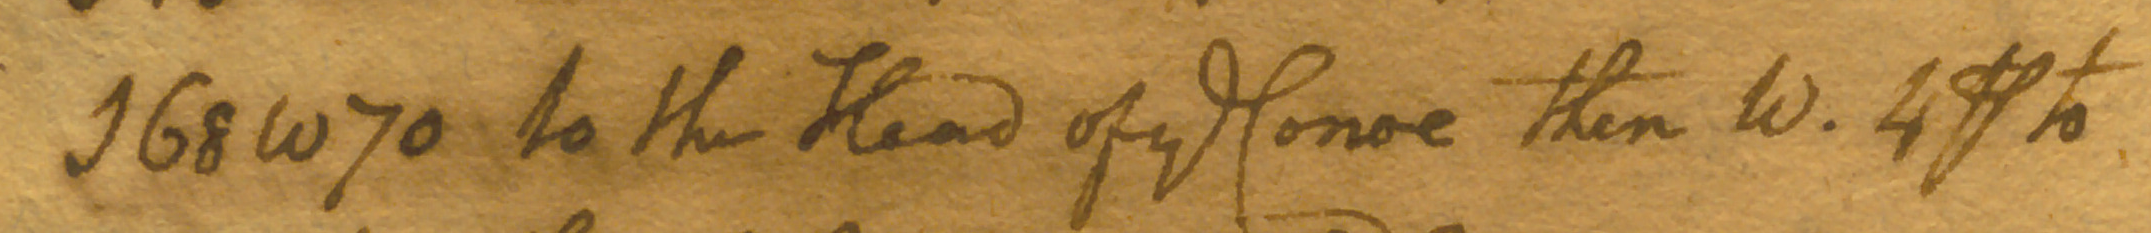S68W70 to the Head of y^e Conoe then W. 4 per to
